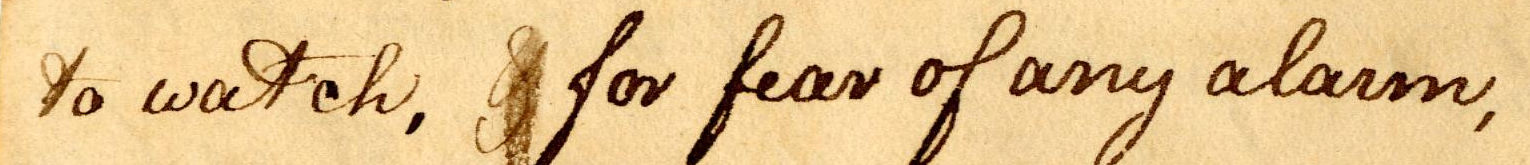to watch, & for fear of any alarm,
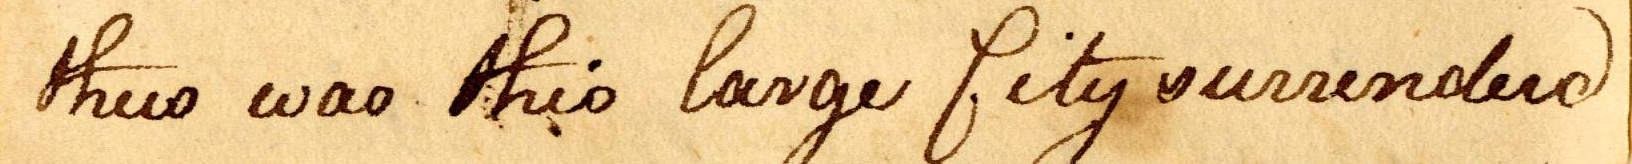thus was this large City surrenderd
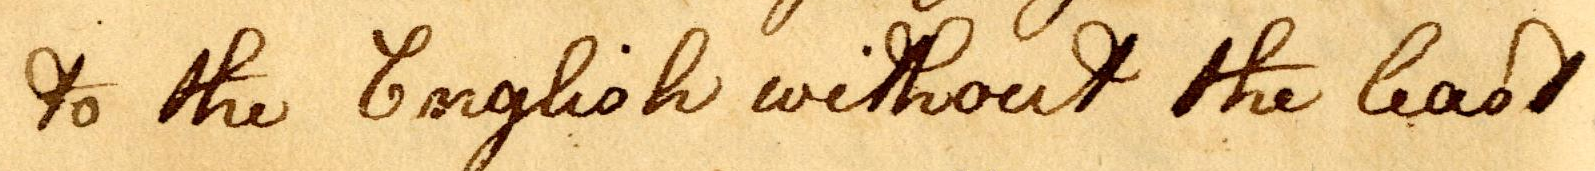to the English without the least
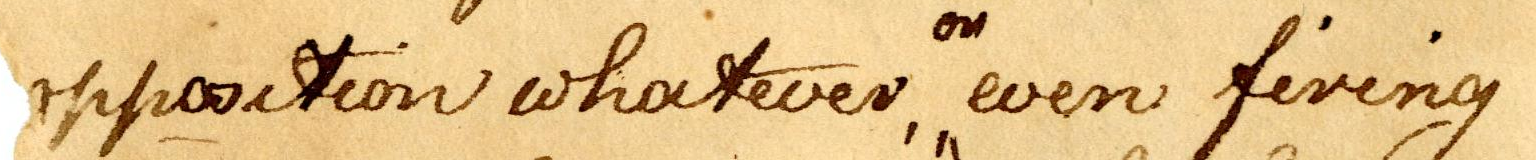opposition whatever, ^on even firing
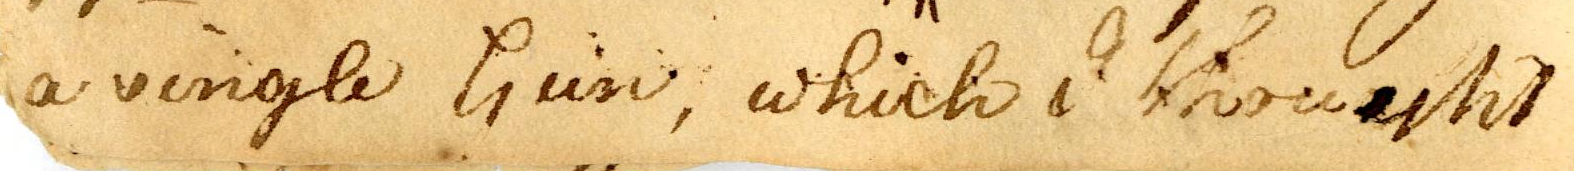a single Gun, which I thought
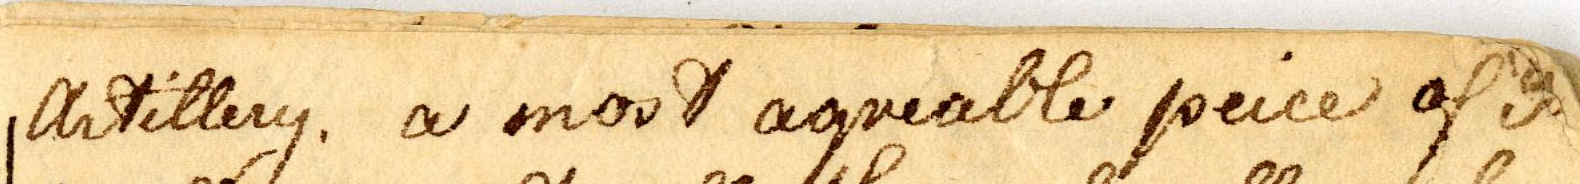Artillery, a most agreable peice of I
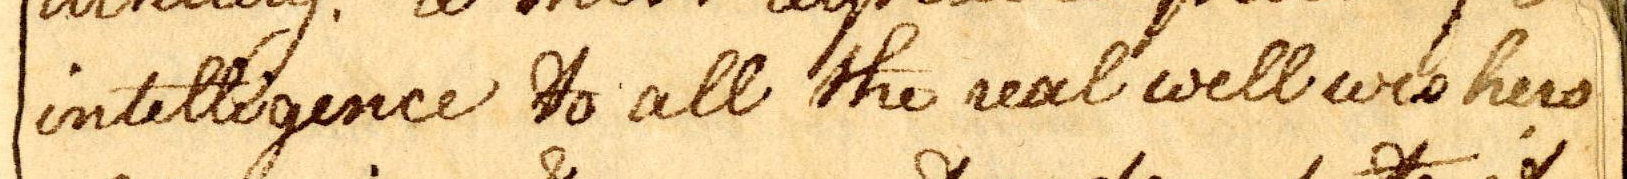intelligence to all the real well wishers
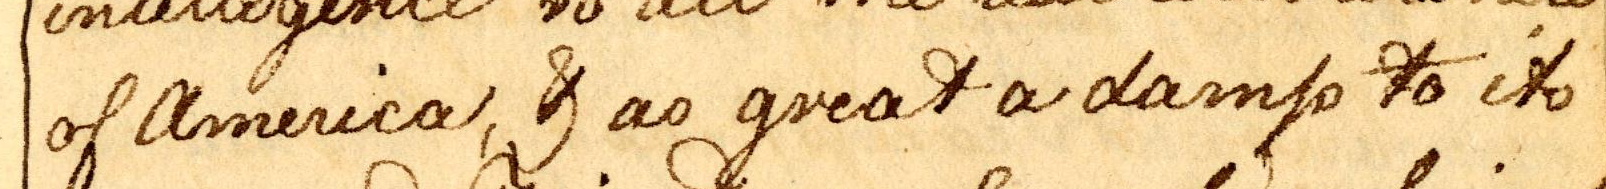of America, & as great a damp to its
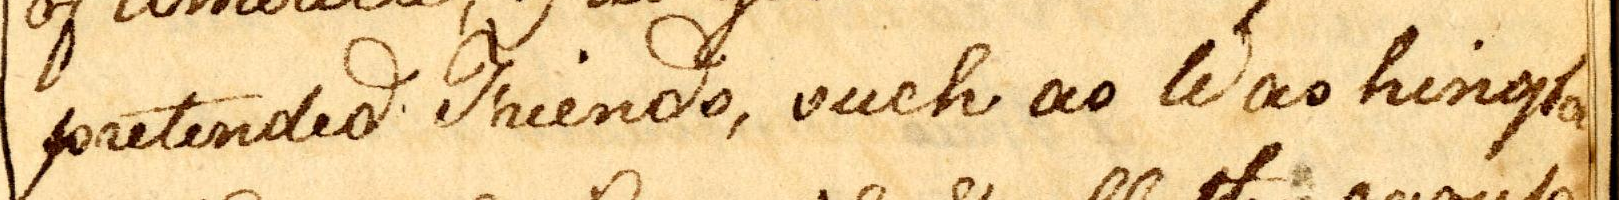pretended Friends, such as Washington
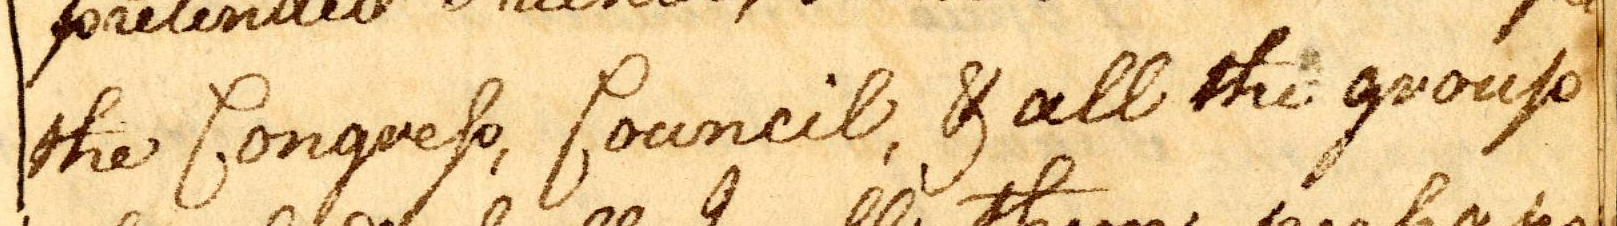the Congress, Council, & all the group
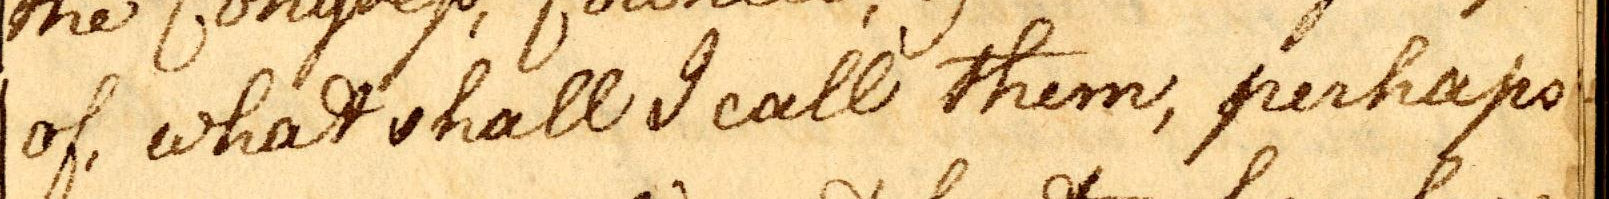of, what shall I call them, perhaps
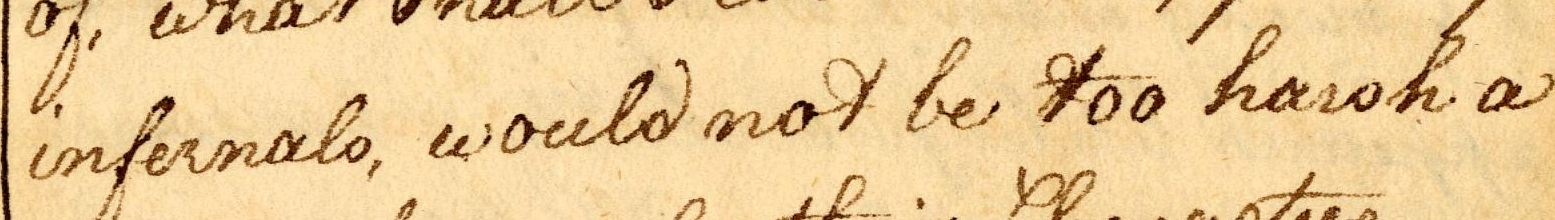infernals, would not be too harsh a
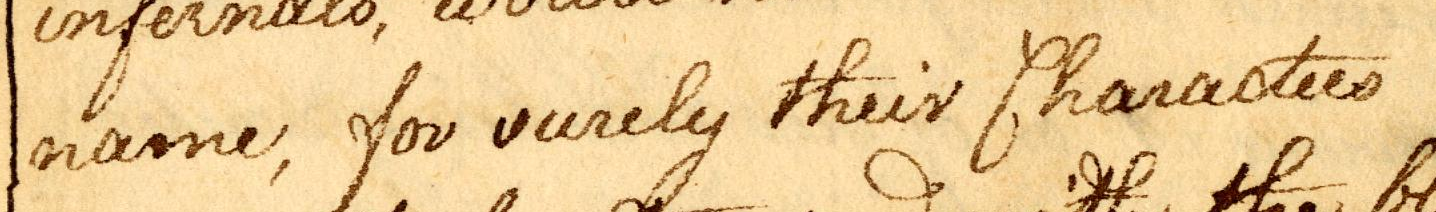name, for surely their Characters
